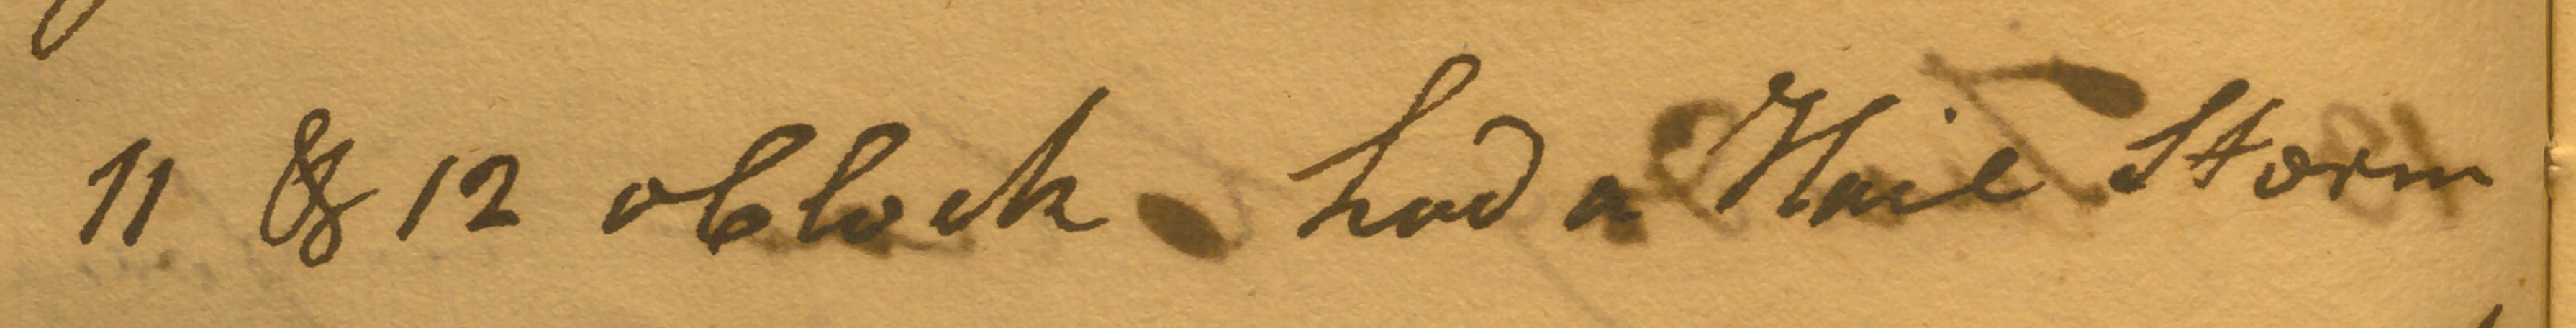11 & 12 oClock had a Hail Storm
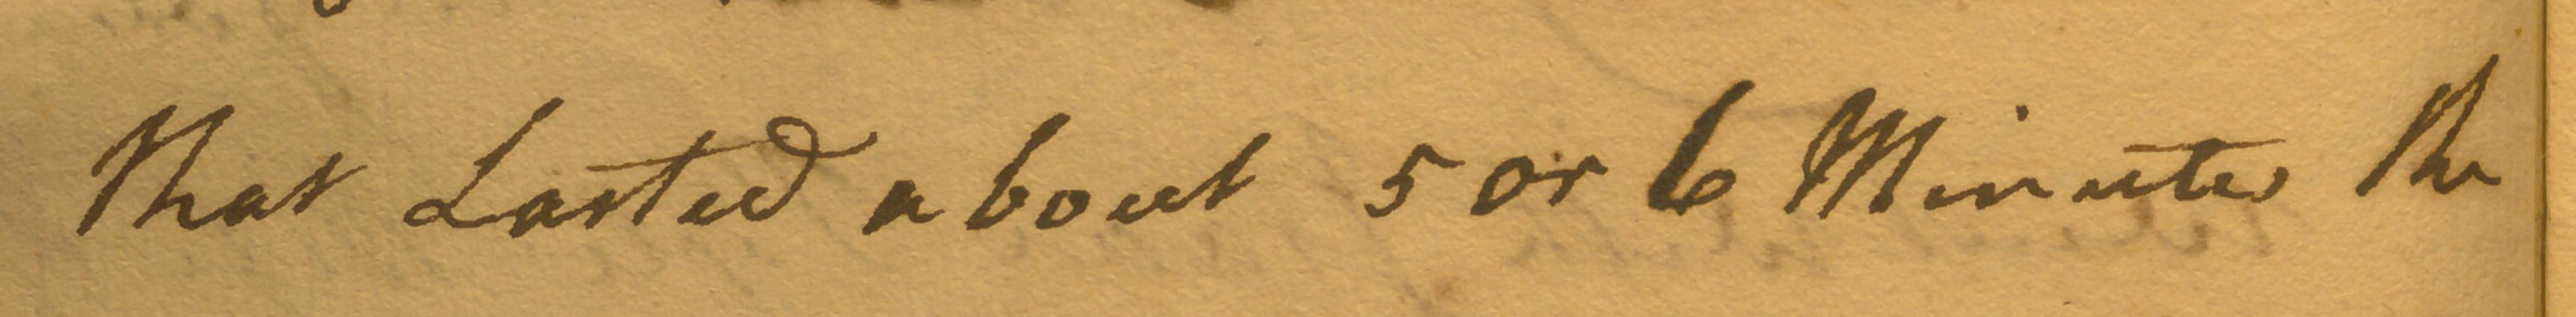that Lasted about 5 or 6 Minutes the
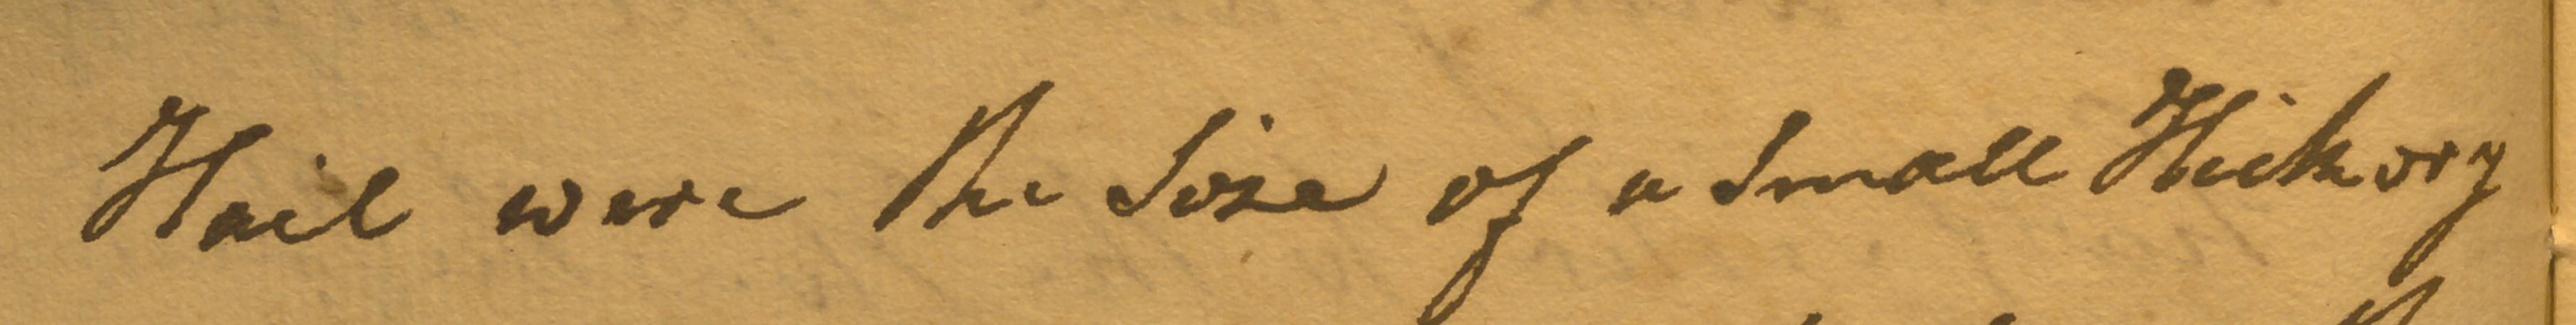Hail were the Size of a small Hickory
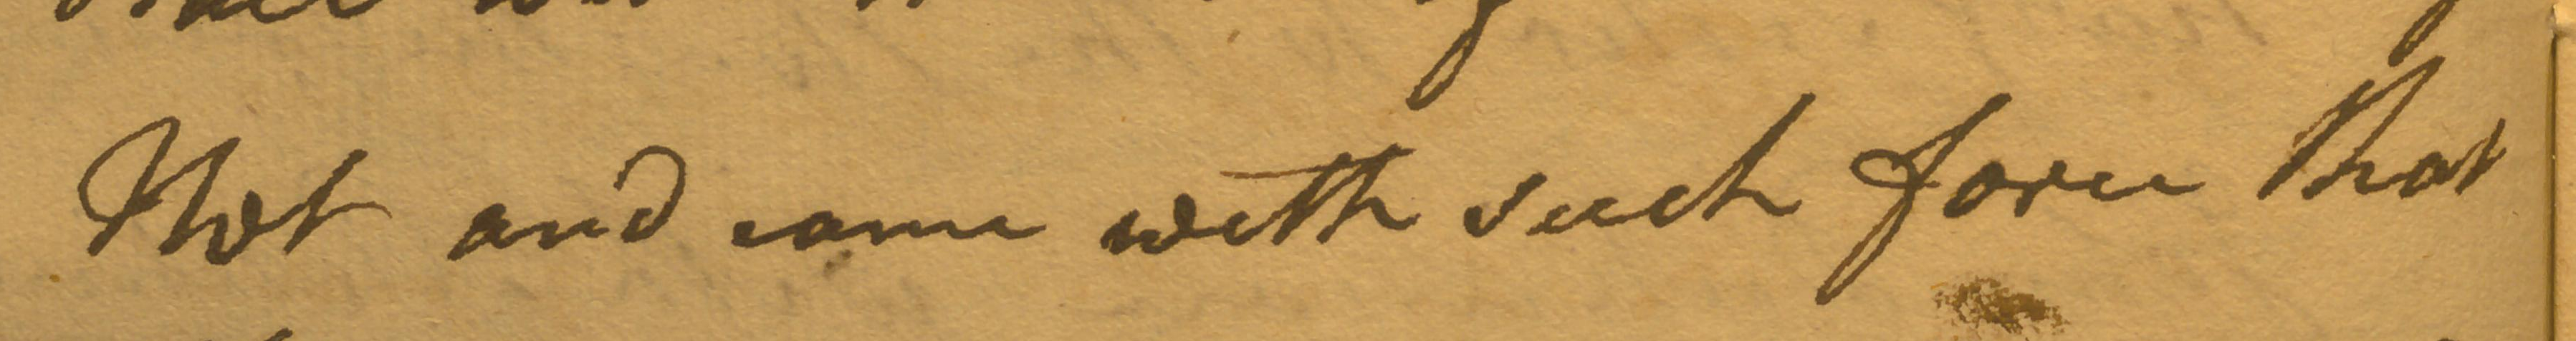Not and came with such force that
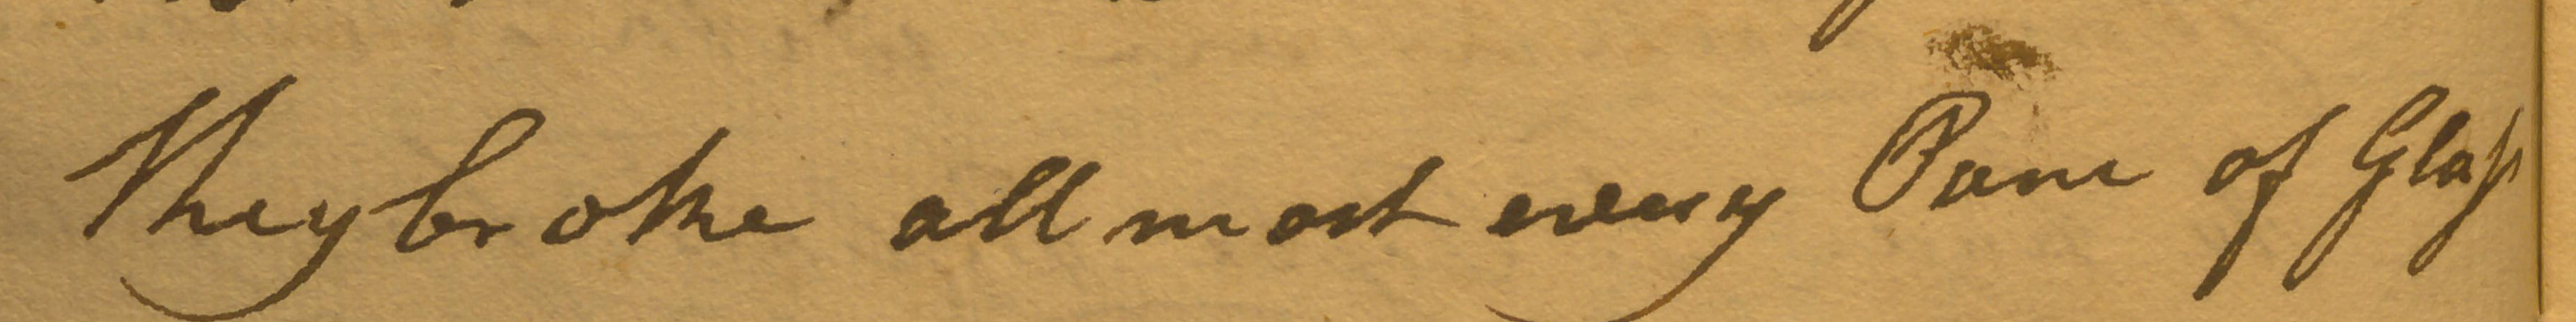they broke allmost every Pane of Glass
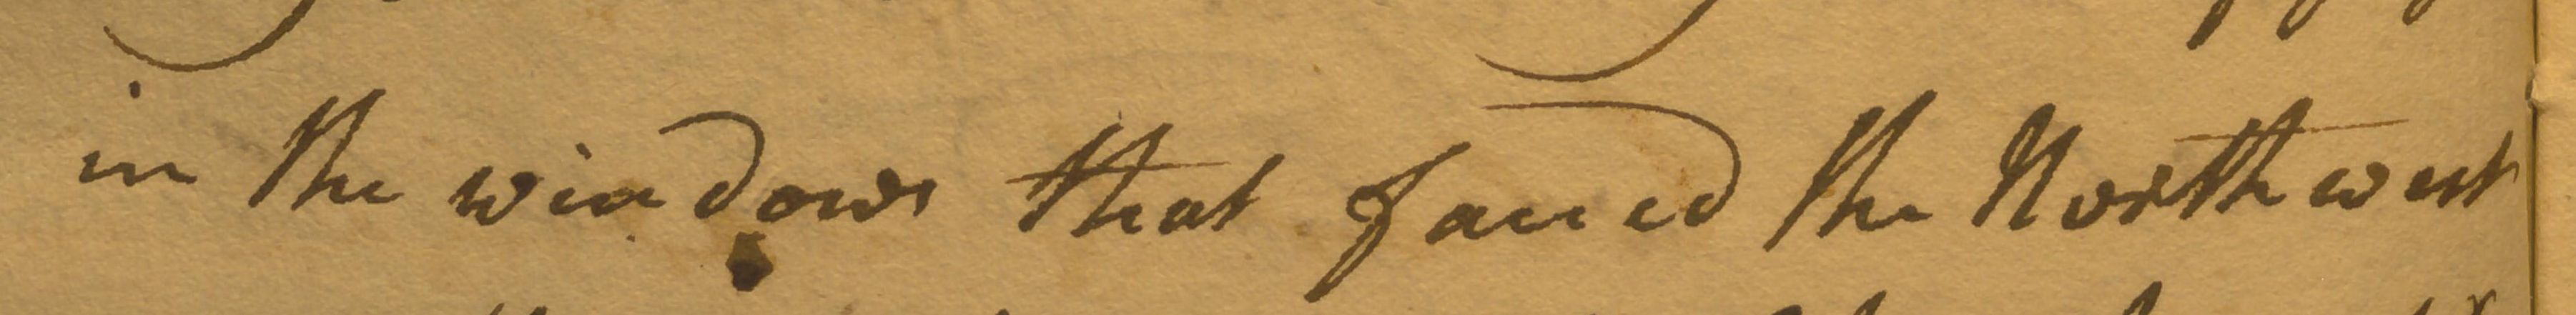in the windows that faned the Northwest
